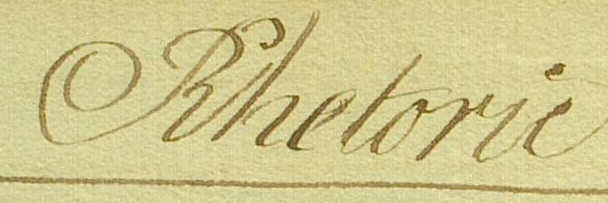Rhetoric
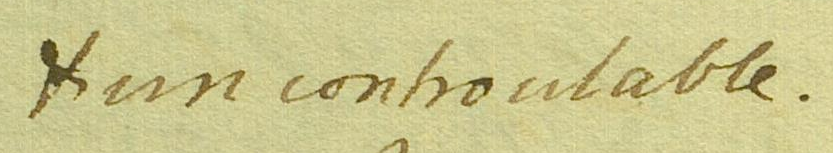& uncontroulable.
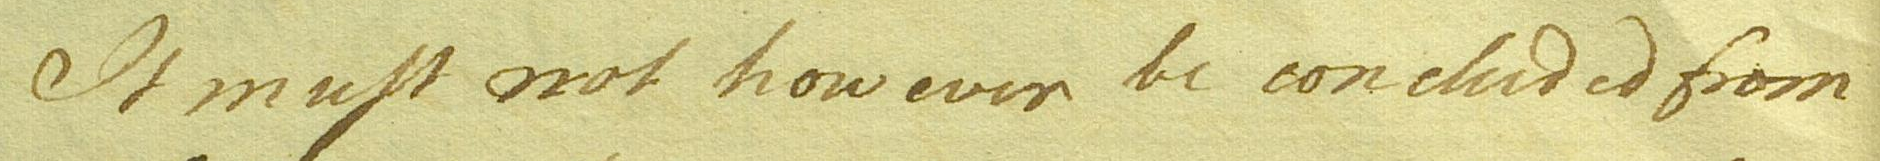It must not however be concluded from
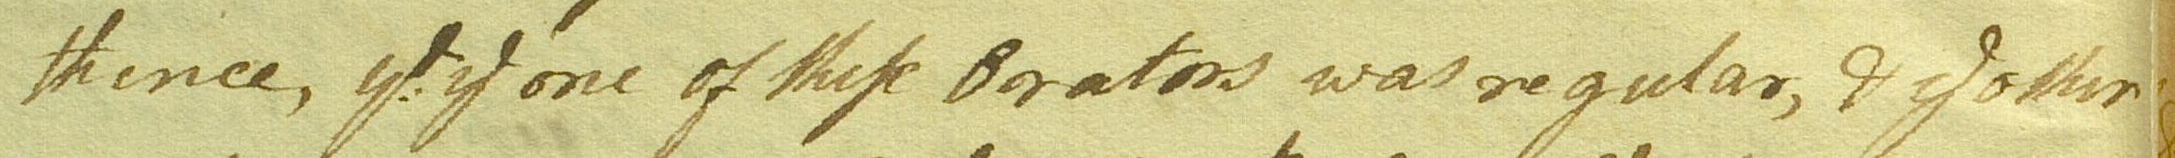thence, y^t: y^e one of these Orators was regular, & y^e other
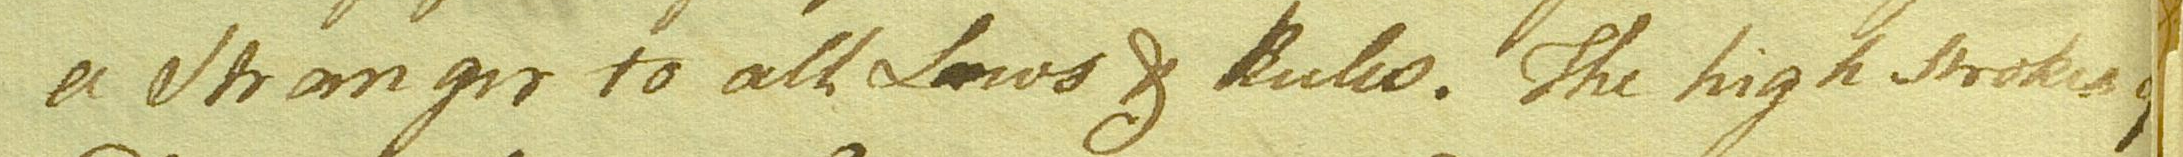a Stranger to all Laws & Rules. The high strokes of
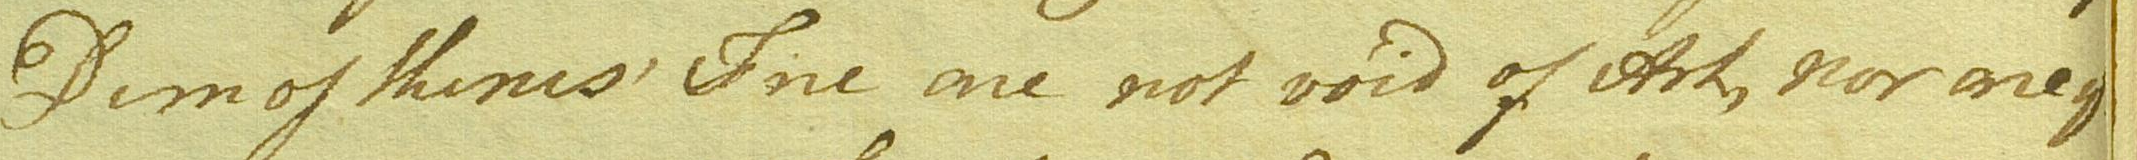Demostheneses' Fire are not void of Ash, nor are y^e
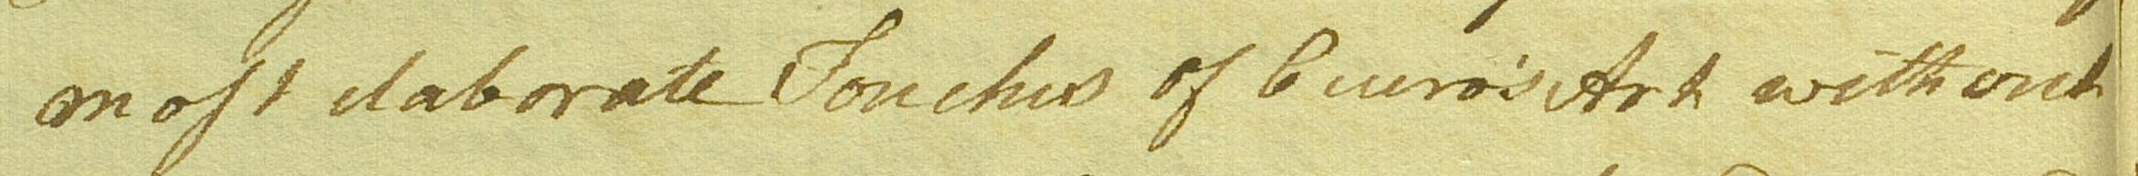most elaborate Touches of Cicero's Art without
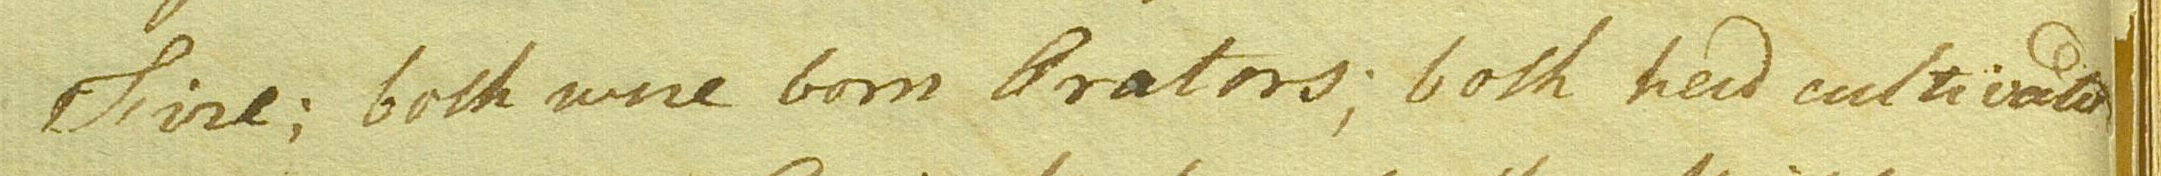Fire; both were born Orators; both had cultivated
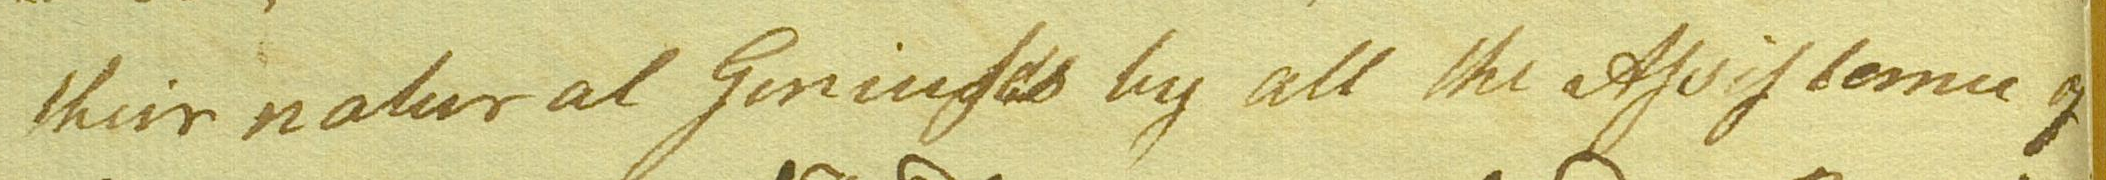their natural Geniuses by all the Assistance of
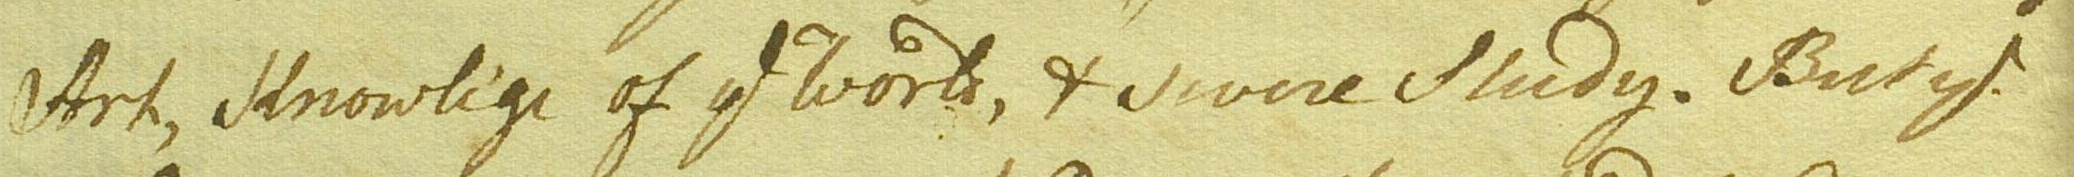Art, Knowledge of y^e Words, & severe Study. But y^e
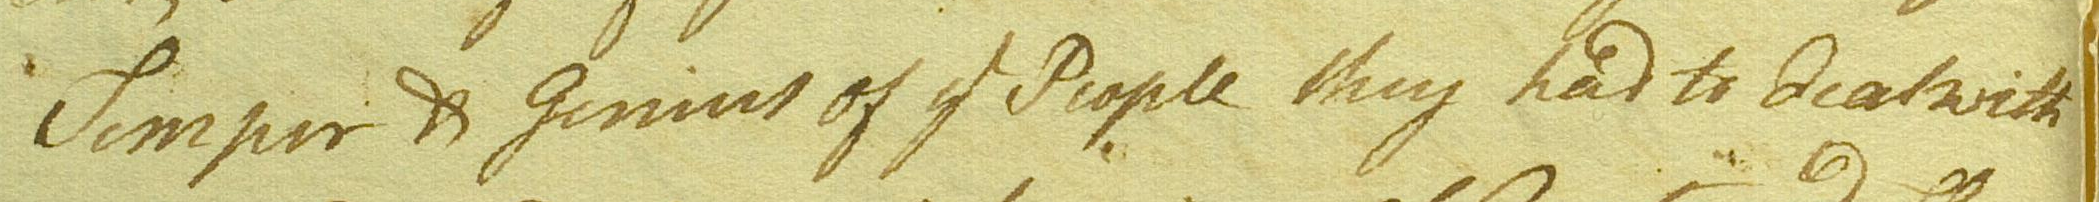Temper & Genius of y^e People they had to deal with
